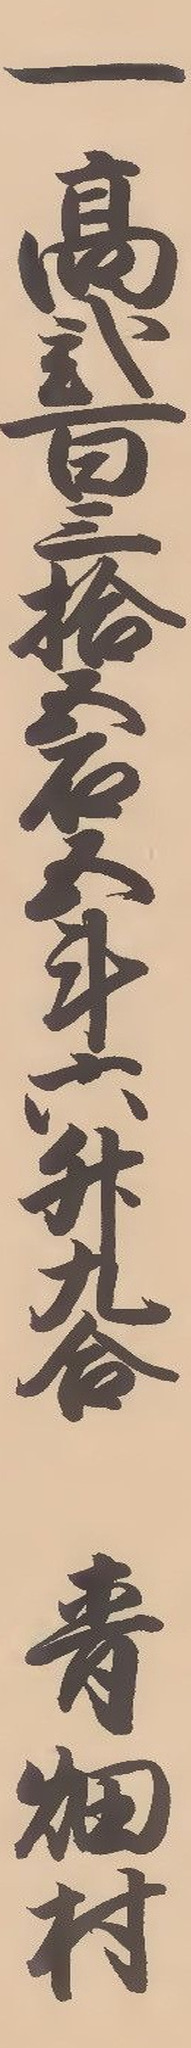一髙弐百三拾五石五斗六升九合青畑村
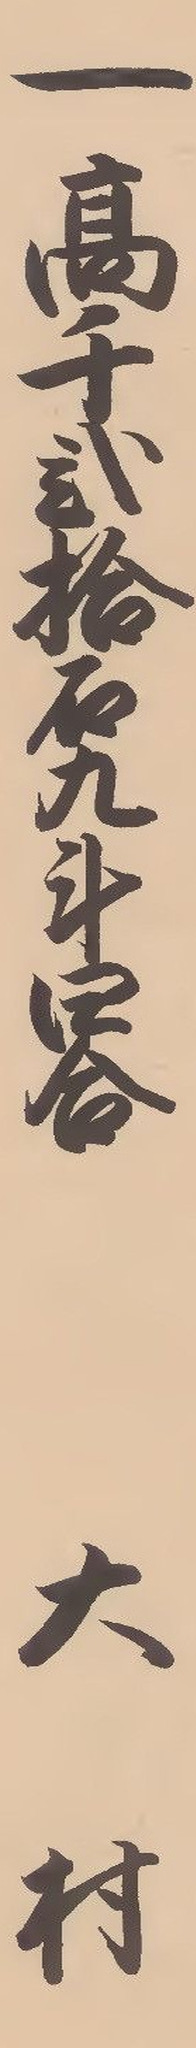一髙千弐拾石九斗四合大村
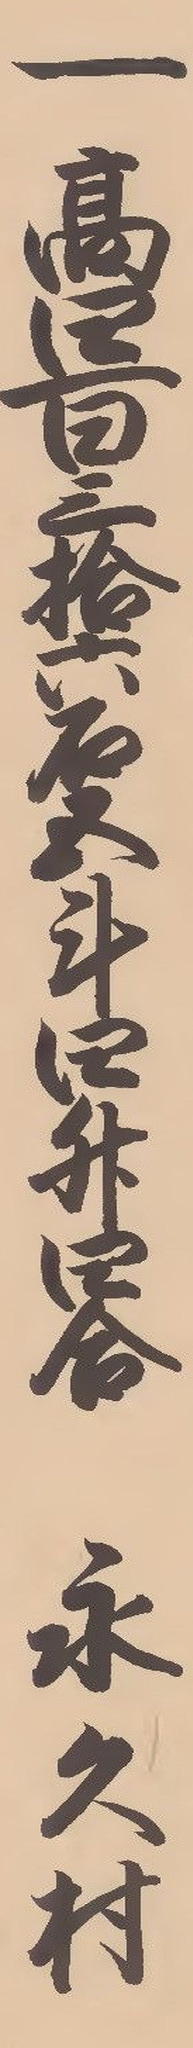一高四百三拾六石五斗四升四合永久村
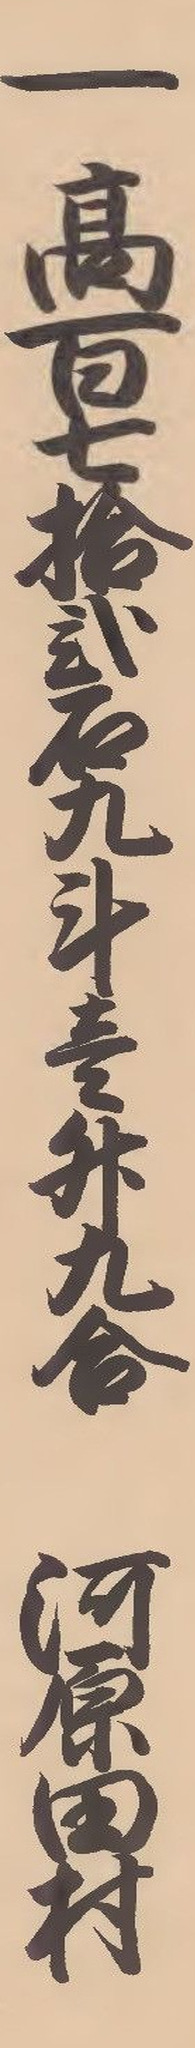一髙百七拾弐石九斗壱升九合河原田村
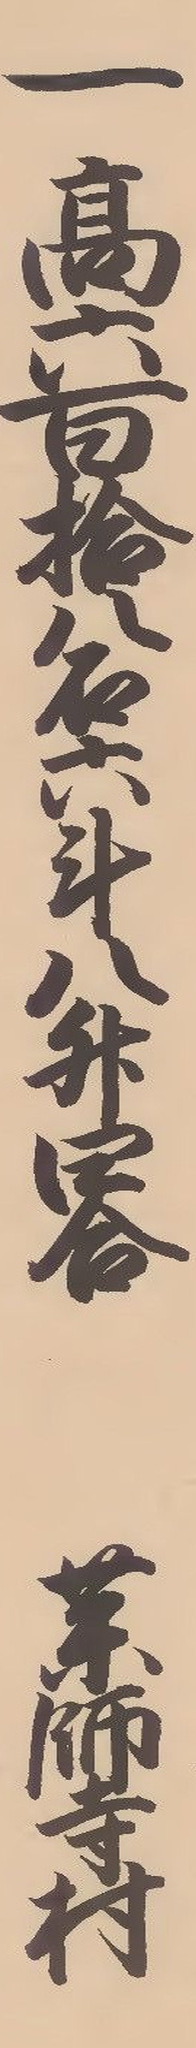一髙六百拾八石六斗八升四合藥師寺村
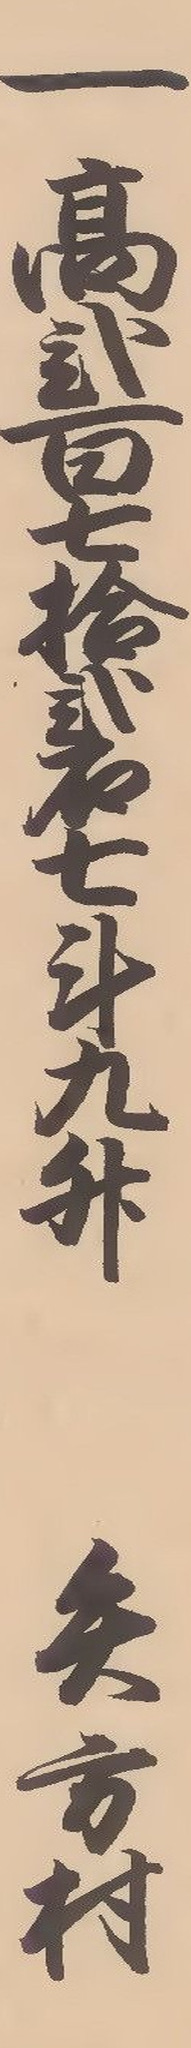一髙弐百七拾弐石七斗九升矢方村
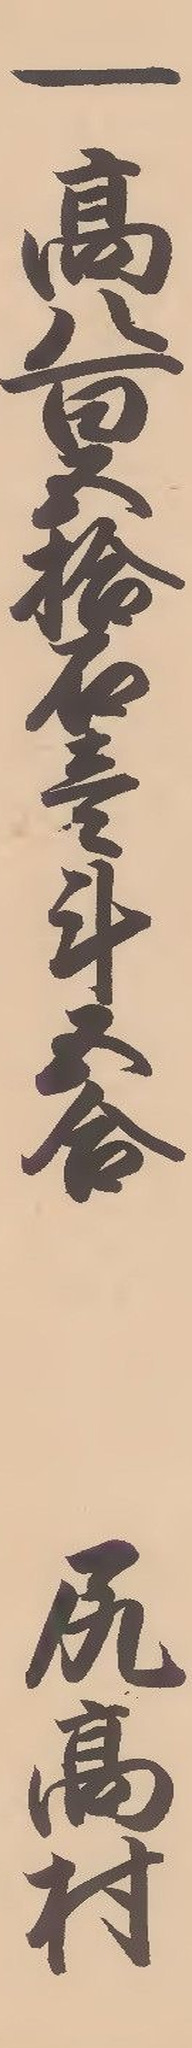一髙八百五拾石壱斗五合尻髙村

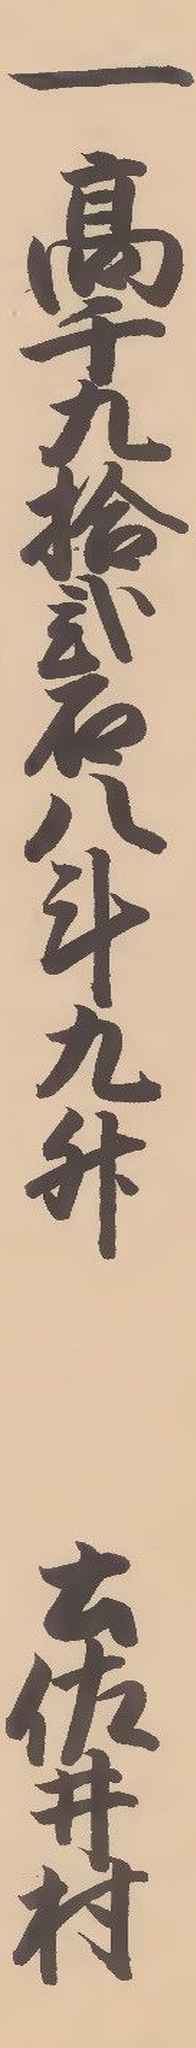一髙千九拾弐石八斗九升土佐井村
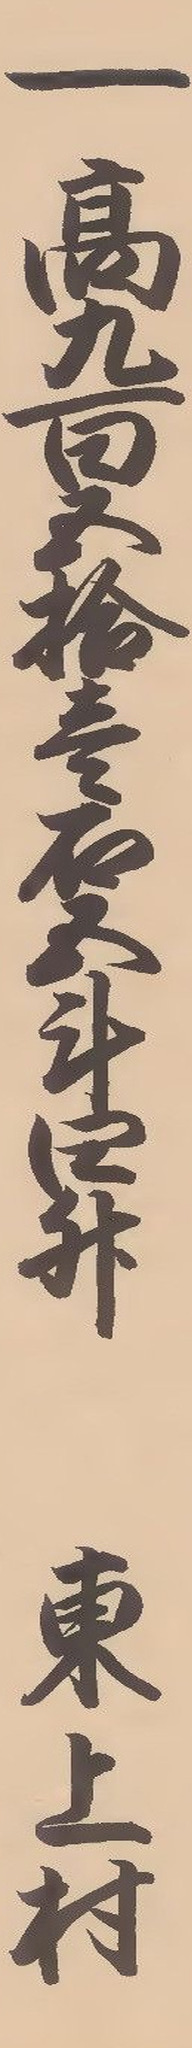一髙九百五拾壱石五斗四升東上村
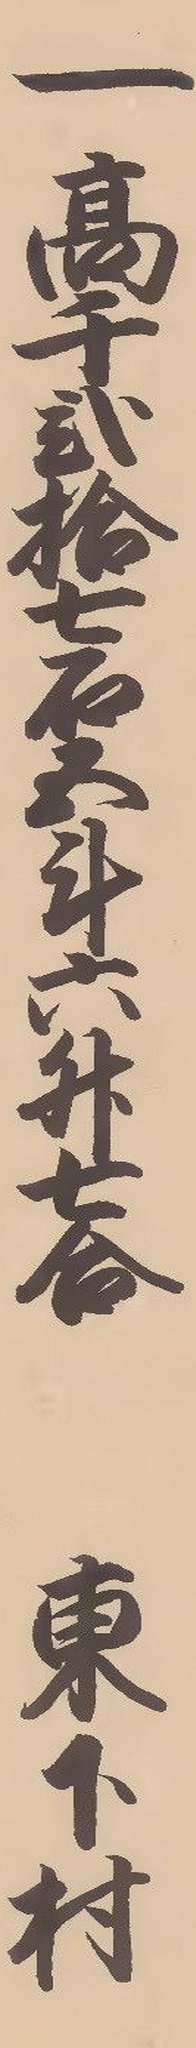一髙千弐拾七石五斗六升七合東下村
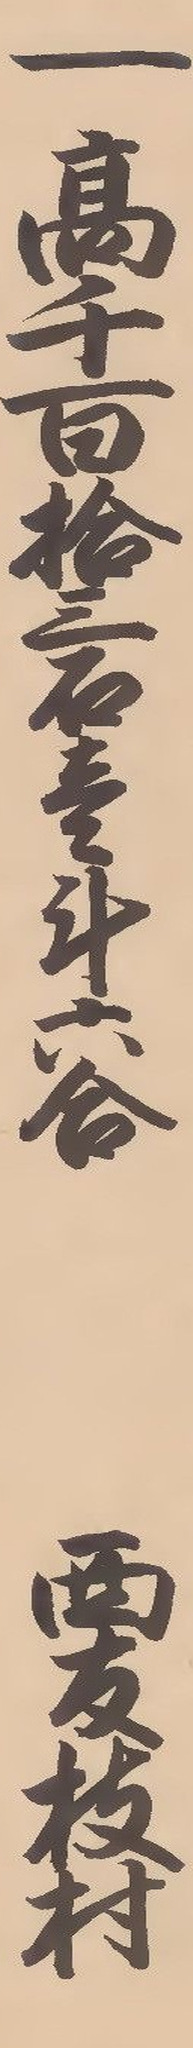一髙千百拾三石壱斗六合西友枝村
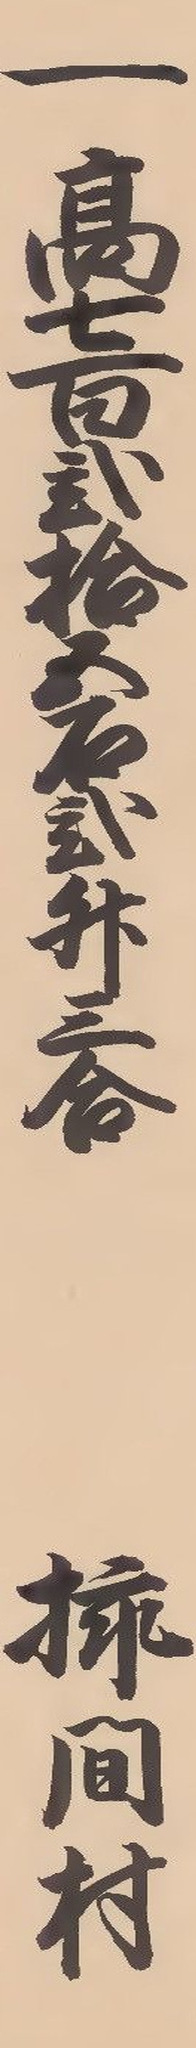一髙七百弐拾五石弐升三合間村
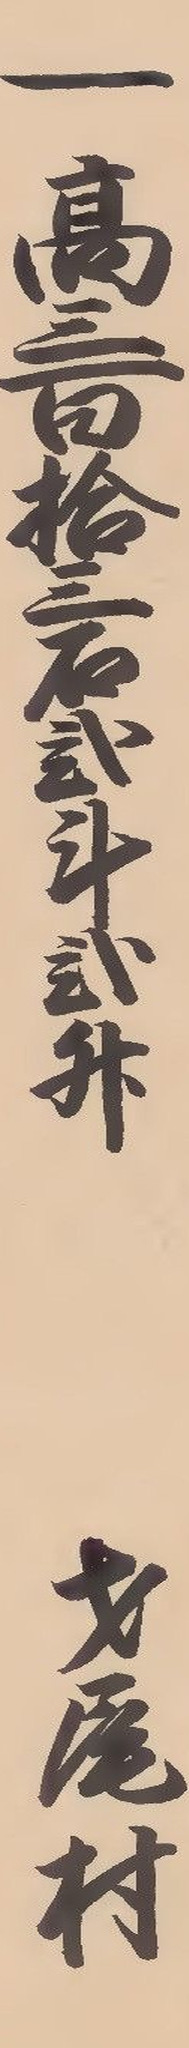一髙三百拾三石弐斗弐升才尾村
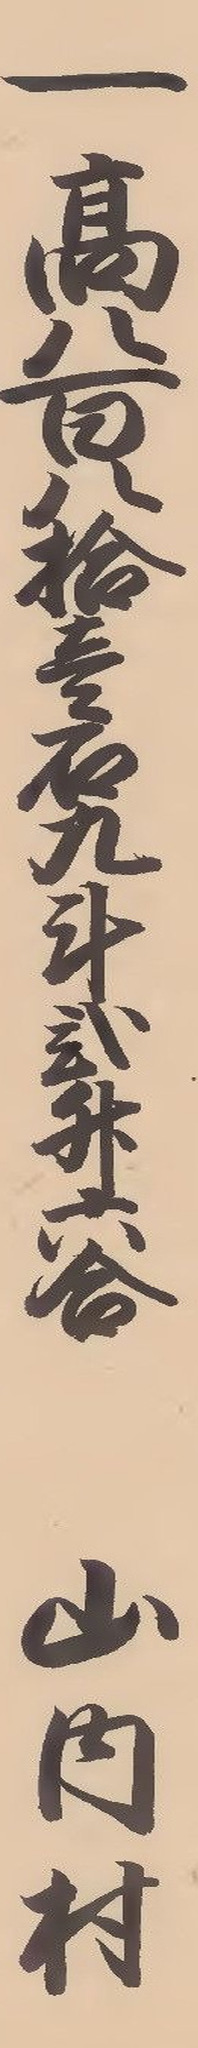一髙八百八拾壱石九斗弐升六合山内村
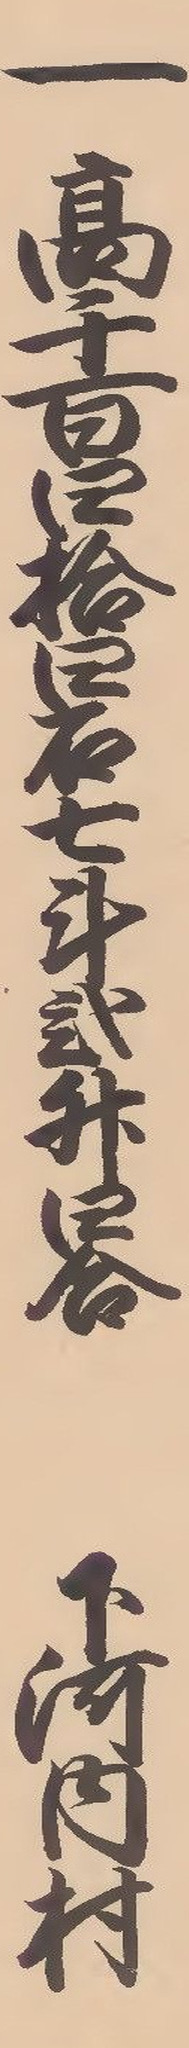一髙千百四拾四石七斗弐升四合下河内村

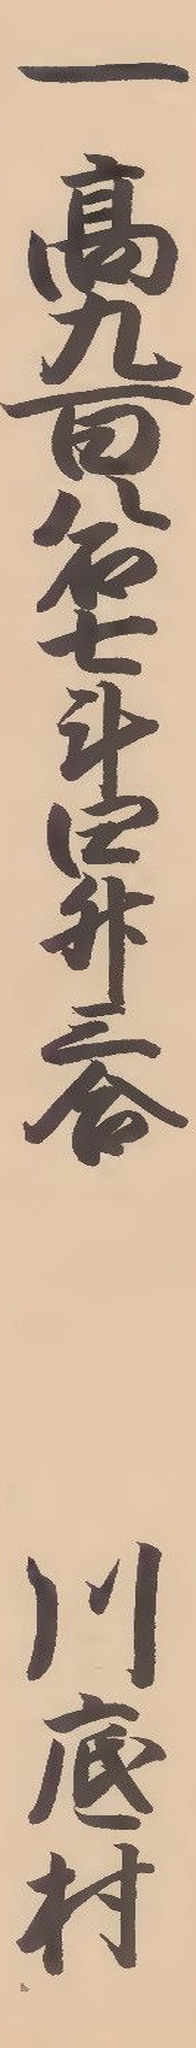一髙九百八石七斗四升三合川底村
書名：豊前国郷帳
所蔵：国立公文書館 National Archives of Japan
